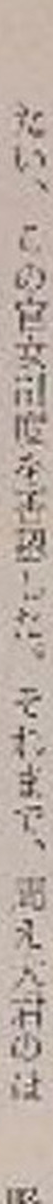たい、この官女制度を否認した。それまで、聞え大君のほ
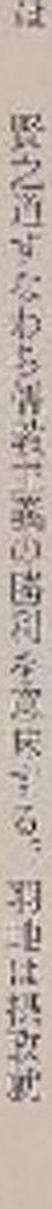賢之道すなわち儒教主義の勝利を意味する。羽地は摂政就
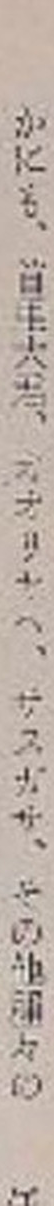かにも、首里大君、オオリヤヘ、サスガサ、その他種々の
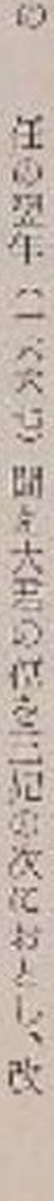任の翌年(一六六七)聞え大君の位を王妃の次におとし、改
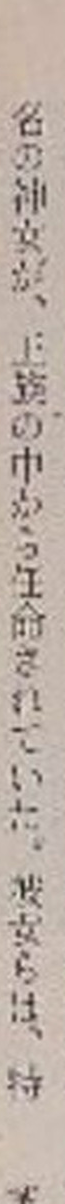名の神女が、王族の中から任命されていた。彼女らは、特
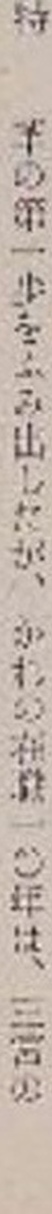革の第一歩をふみ出したが、かれの在職一〇年は、王宮の
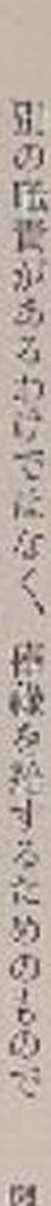別の責があるわけではなく、俸禄をするためのもので
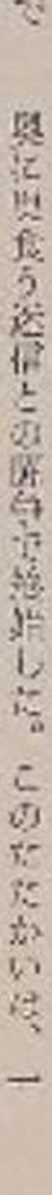奥に巣食う迷信との闘争で終始した。このたたかいは、一
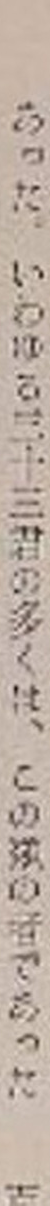あった。いわゆる三十三君の多くは、このの者であった
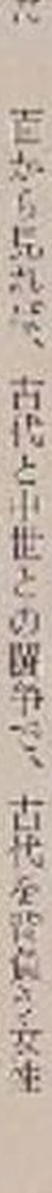面から見れば、古代と中世との闘争で、古代を背負う女性
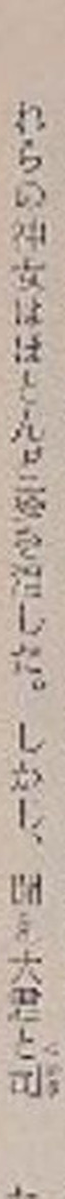れらの神女はほとんど姿を消した。しかし、聞え大君と司
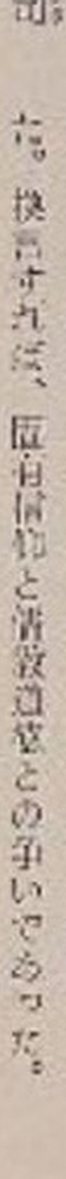た。換言すれば、固有信仰と儒教道徳との争いであった。
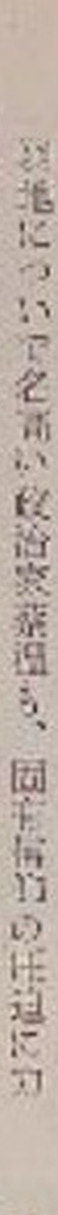羽地についで名高い政治家蔡温も、固有信仰の圧迫に力
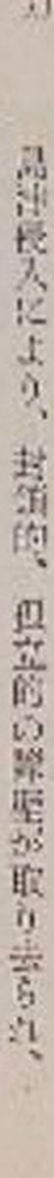島津侵入により、封鎖的、孤立的の障壁が取り去られ、
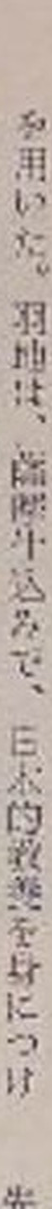を用いた。羽地は、薩摩仕込みで、日本的教養を身につけ
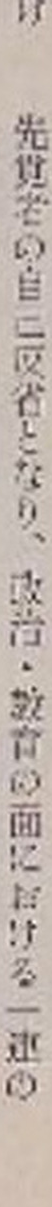先覚者の自己反省となり、政治・教育の面における一連の
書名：沖縄固有信仰のおとろえ
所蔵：University of the Ryukyus Library
